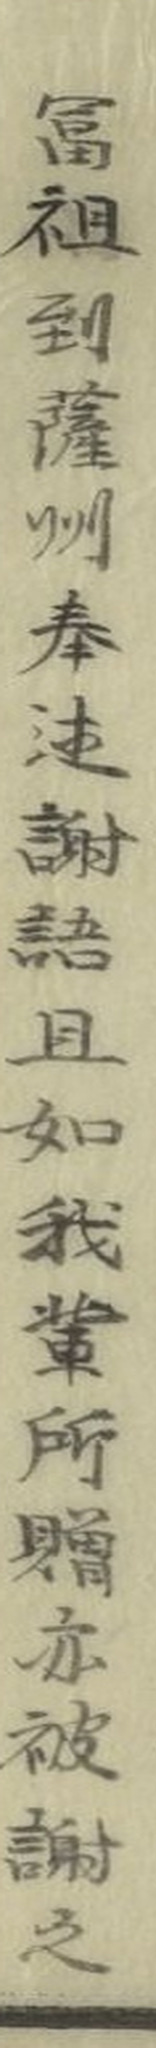富祖到薩州奉述謝語且如我輩所贈亦被謝之
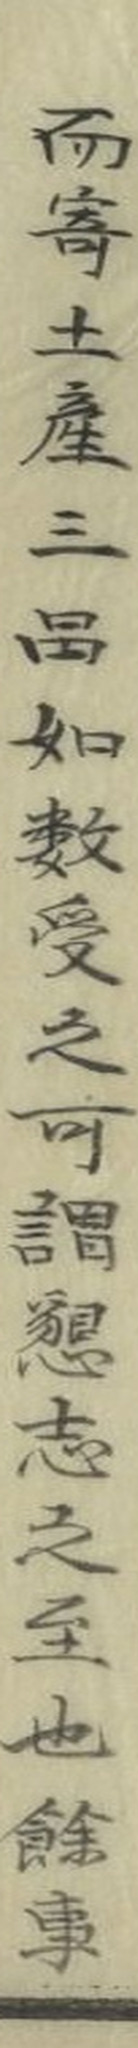而寄土産三品如数受之可謂懇志之至也余事
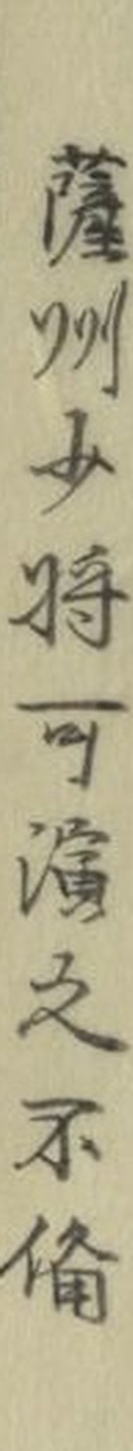薩州少将可演之不備

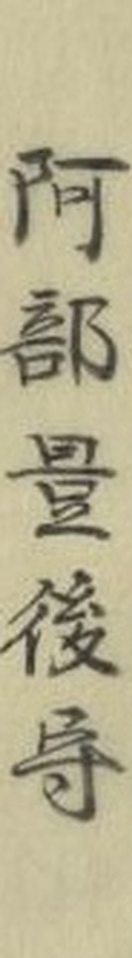阿部豊後守
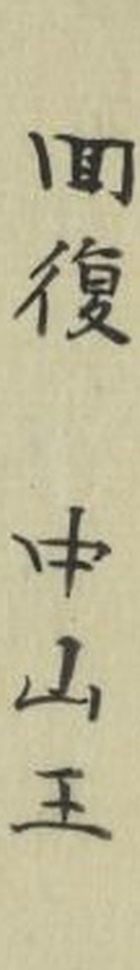回復中山王
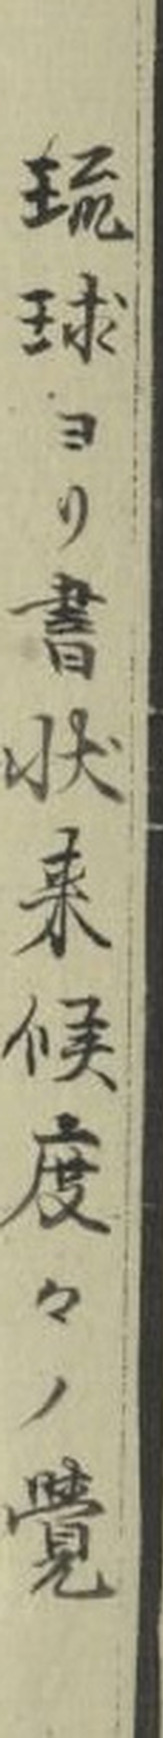琉球ョㇼ書状来候度々ノ覚
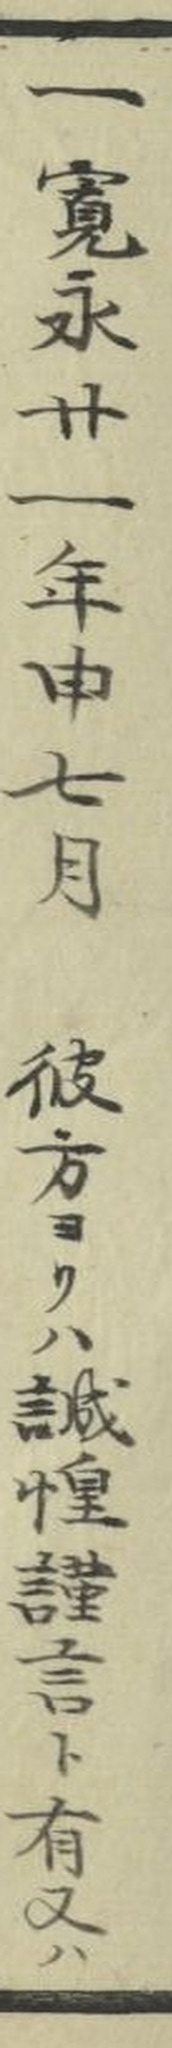一寛永廿一年申七月彼方ョㇼㇵ誠惶謹言ㇳ有又ㇵ
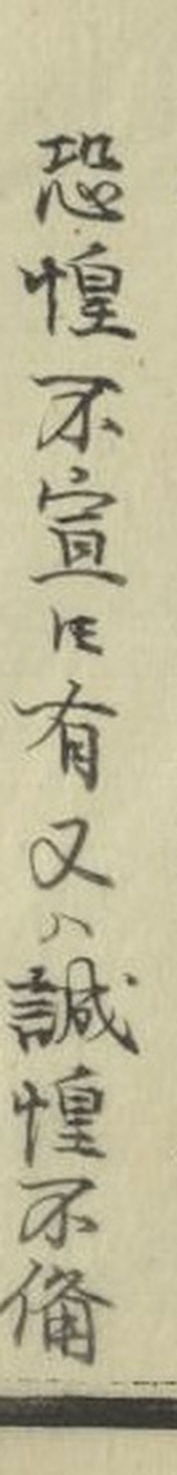恐惶不宣ㇳモ有又ㇵ誠惶不備
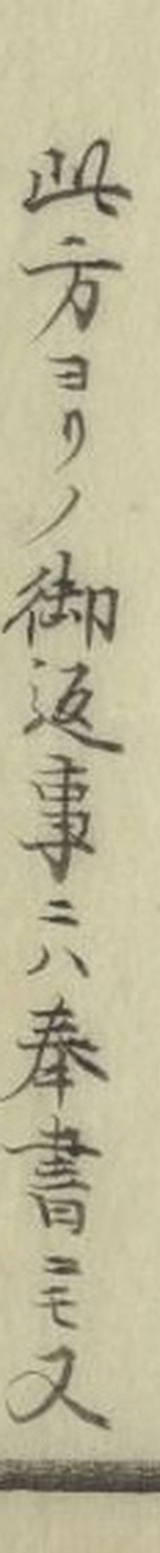此方ョㇼノ御返事ニハ奉書ニモ又
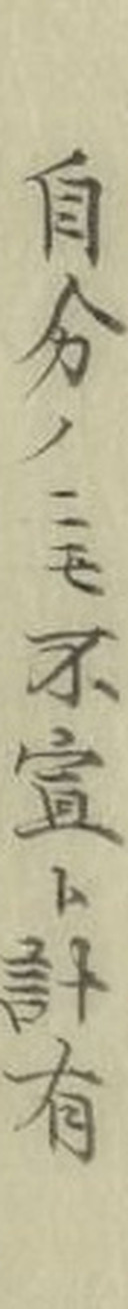自分ノニモ不宣ㇳ計有
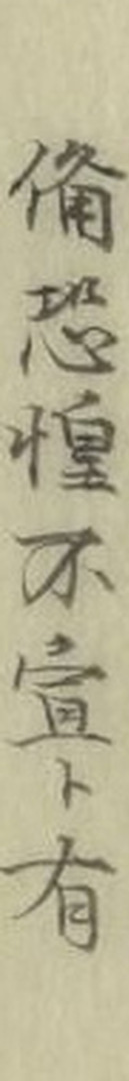備恐惶不宣ㇳ有
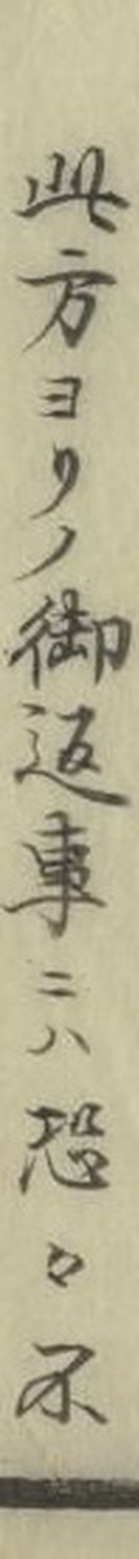此方ョㇼノ御返事ニハ恐々不
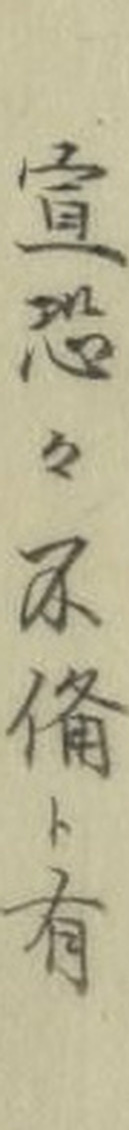宣恐々不備ㇳ有

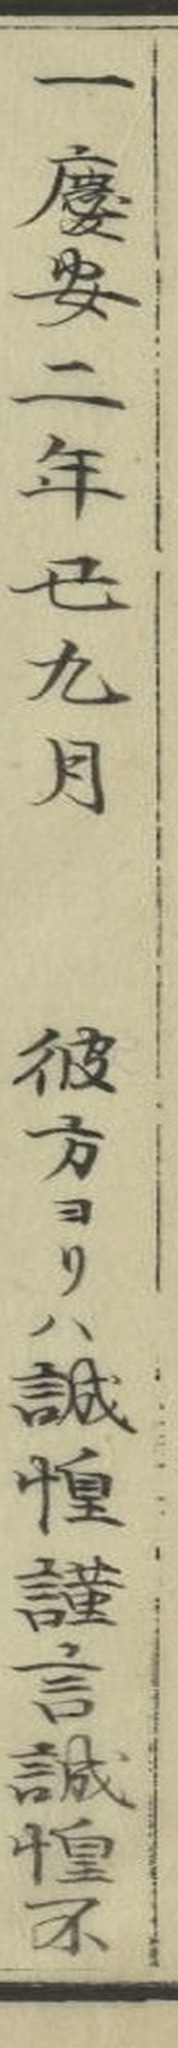一慶安二年巳九月彼方ョㇼㇵ誠惶謹言誠惶不
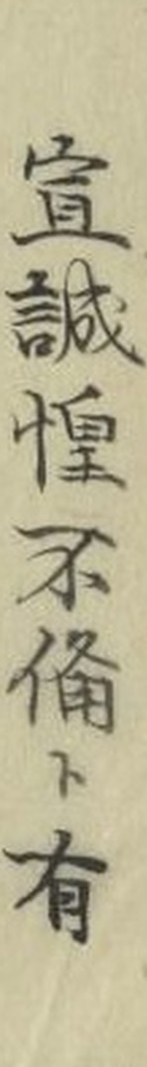宣誠惶不備ㇳ有
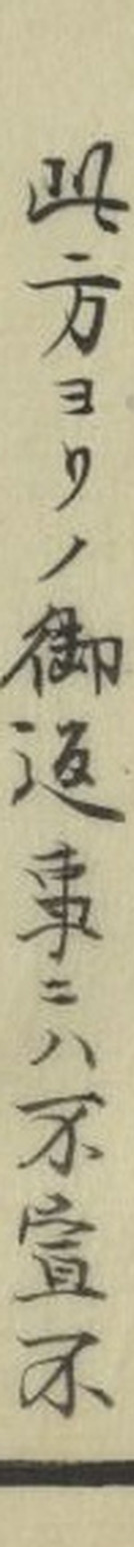此方ョㇼノ御返事ニハ不宣不
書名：琉球往来（上）
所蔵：University of the Ryukyus Library
